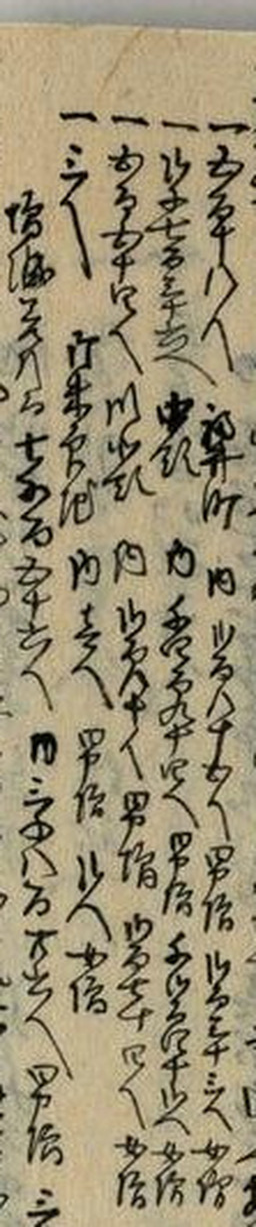一五百五十四人川北領内弐百八十人男増弐百七十四人女増
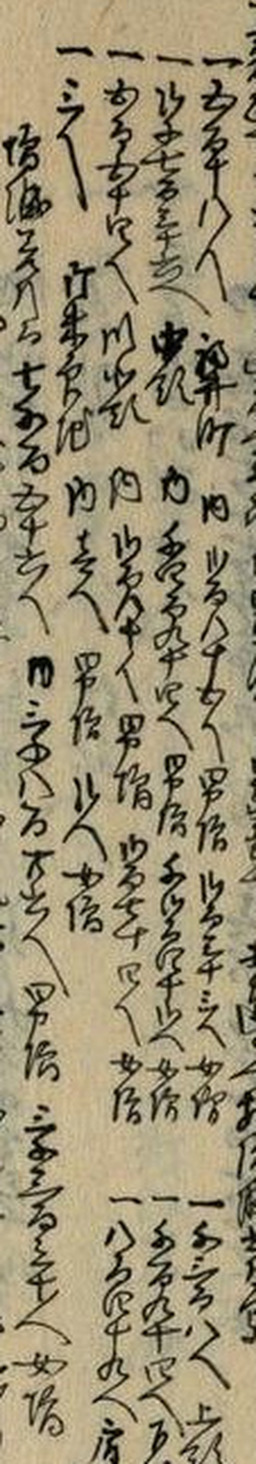一五百五十四人川北領内弐百八十人男増弐百七十四人女増
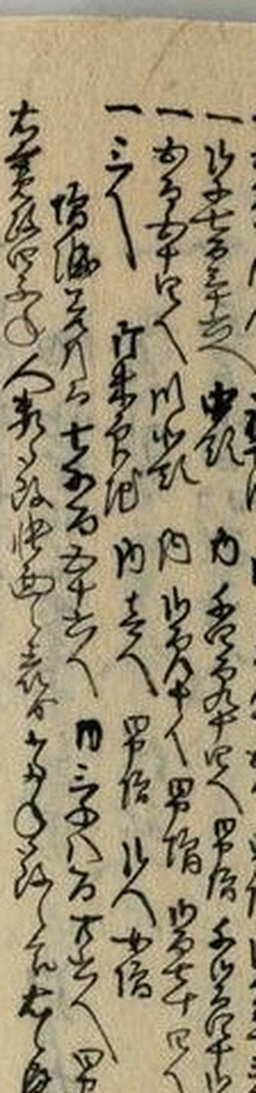一三人御朱印地内壱人男増弐人女増
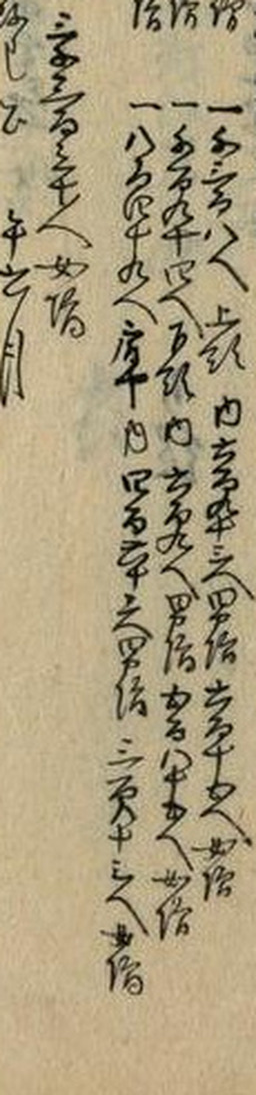一八百四十九人府中内四百六十六人男増三百八十三人女増
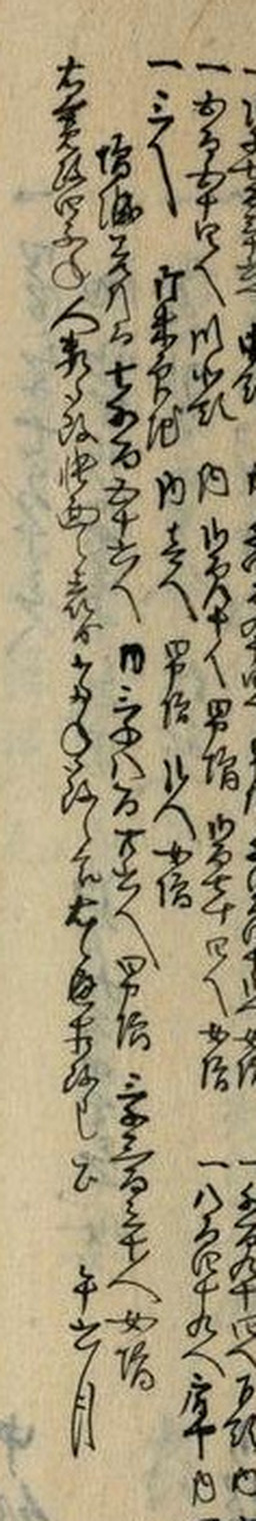増減差引而七千百五十六人内三千八百廿六人男増三千三百三十人女増
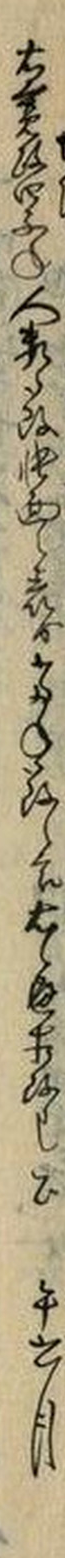右寛政四子年人数御改帳面之表ゟ当年御改之節右之通相改申候以上午六月

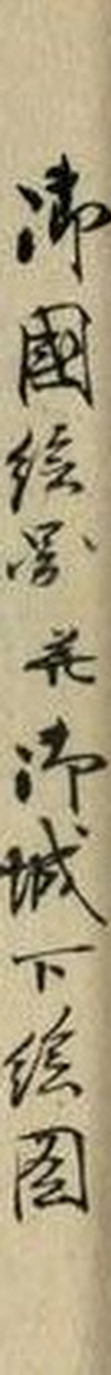御国絵図幷御城下絵図
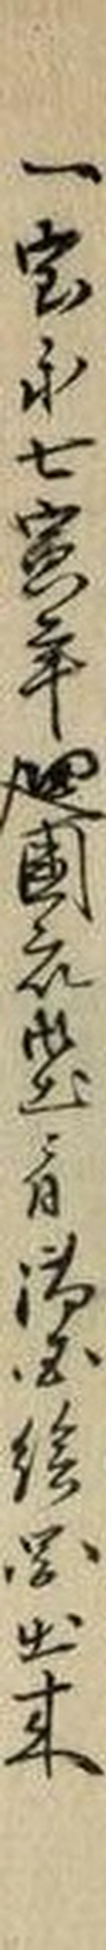一宝永七寅年廻国衆御出ニ付御国絵図出来
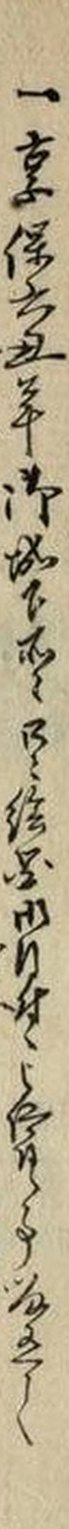一享保六丑年御城下所々口々絵図御目付へ被仰付候事留有之
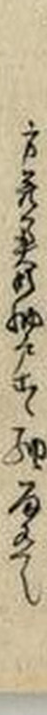方幷奥御納戸等へ納留有之
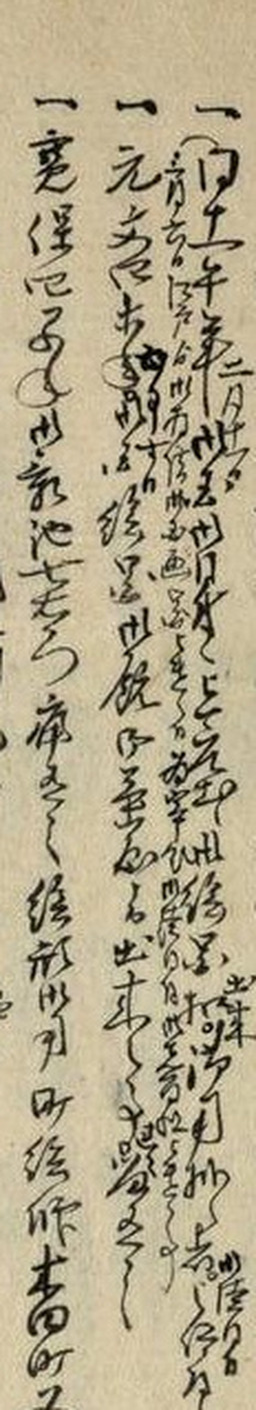一元文四未年五月十日御国絵図御厩御茶屋ニ而出来候事連々留有之
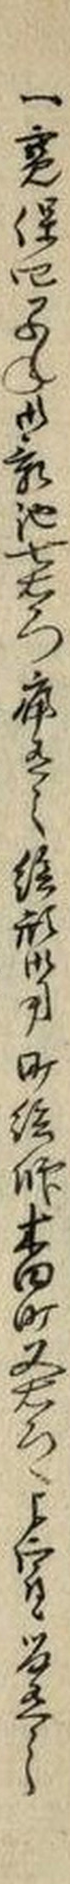一寛保四子年御影池七右衛門痛有之絵形御用町絵師木田町又右衛門へ被仰付候留有之
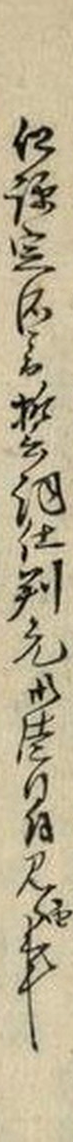但評定所ニ而誓詞仕判允御徒目付見届候事
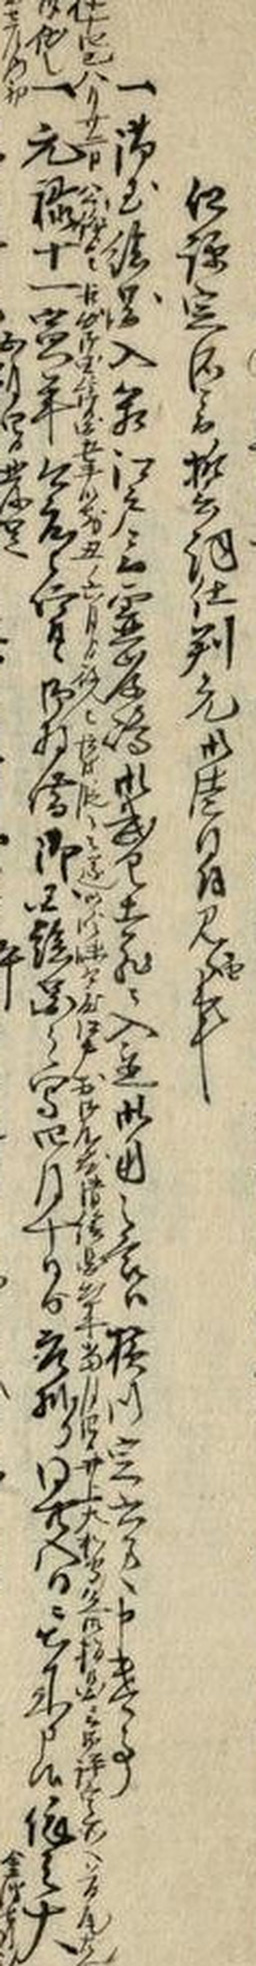一御国絵図入箱江戸ニ而霊岸嶋御武具土蔵ニ入置御用之節ハ横川定六方へ申遣
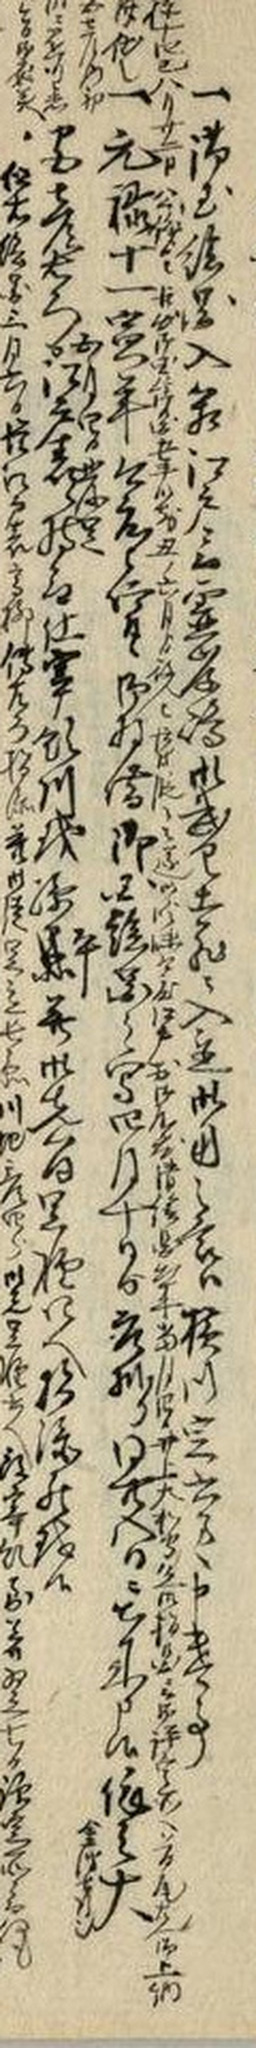一元禄十一寅年今度被仰付候御拝借御国絵図之写四月十日ゟ取掛り同廿八日ニ出来申候依之大金津奉行也
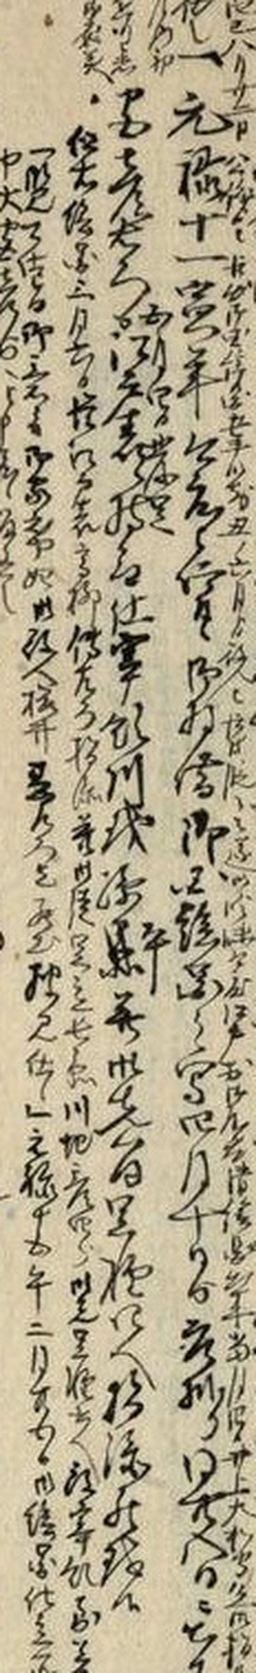宮彦右衛門五月四日発足江戸表へ持参仕宰領川越孫平幷御先筒足軽四人指添罷越候
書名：御国他国諸事之部
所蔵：福井県文書館 Fukui Prefectural Archives
